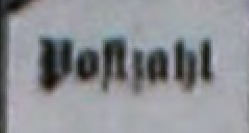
Postzahl
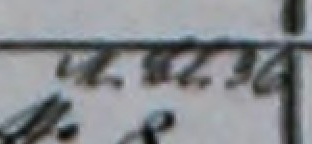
M. Bl. 36
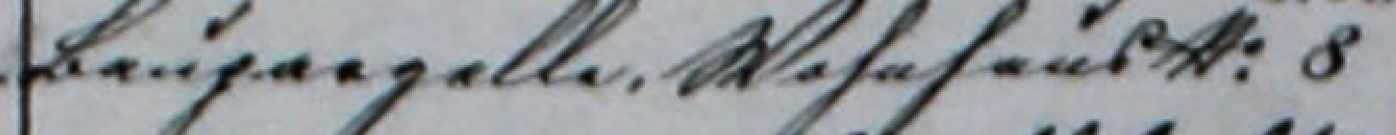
Baugargelle, Wohnhaus N: 8
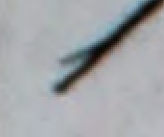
1
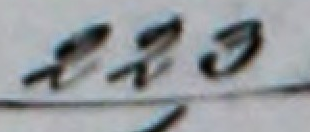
223
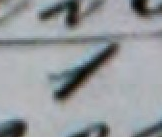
1
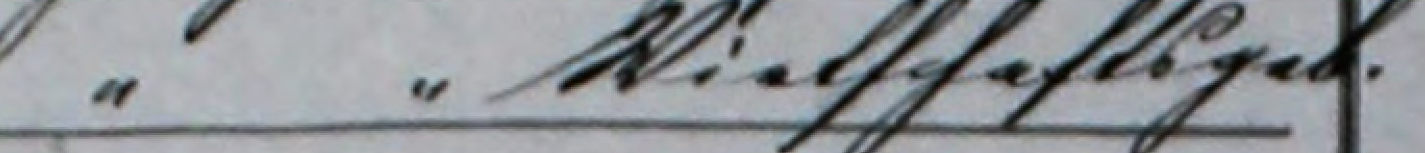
„ „ Wirtschaftsgeb.
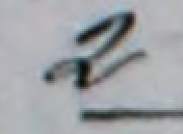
2
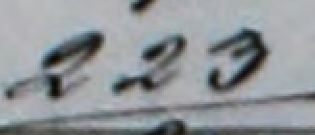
223
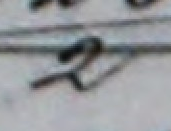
2
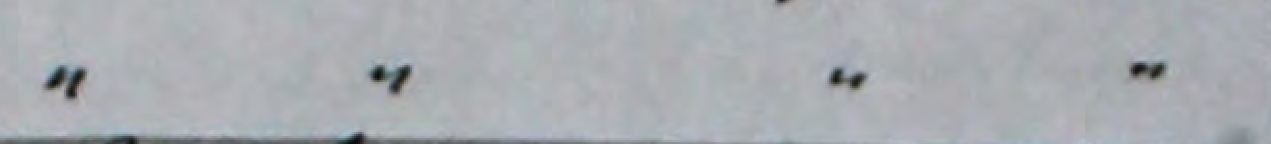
„ „ „ „
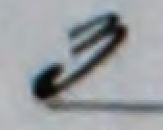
3
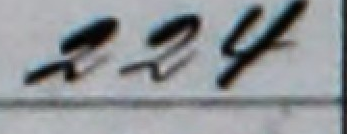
224
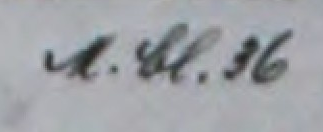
Wiese
